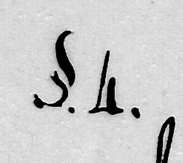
§. 4.
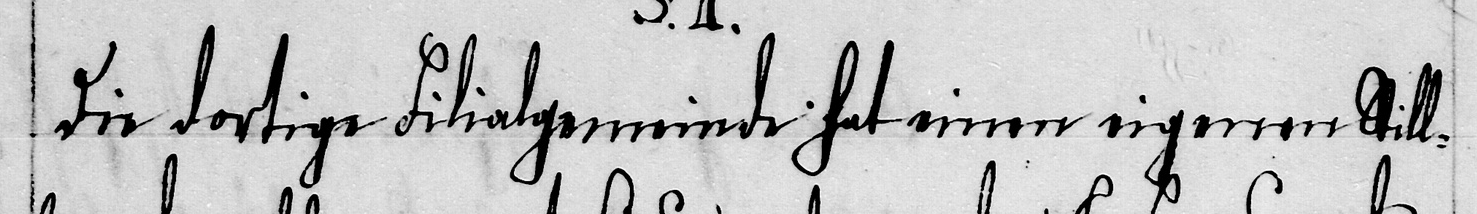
Die dortige Filialgemeinde hat einen eigenen Stil¬
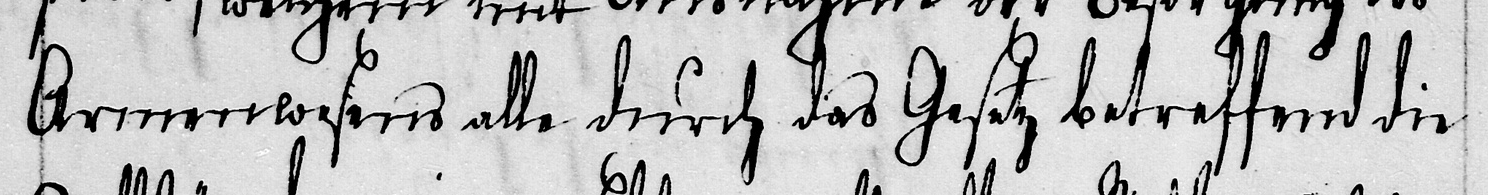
Armenwesens alle durch das Gesetz betreffend die
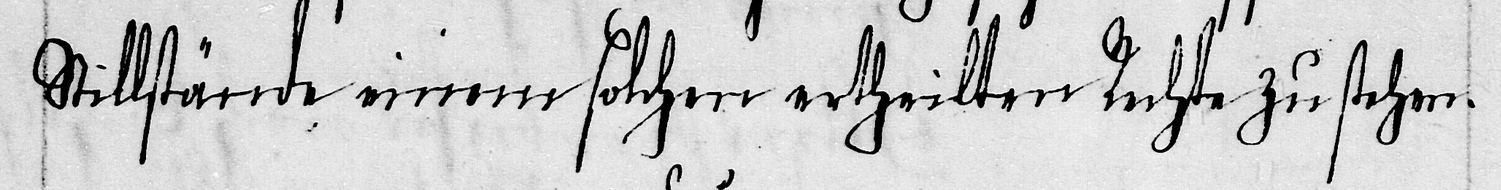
Stillstände einem solchen ertheilten Rechte zustehen.
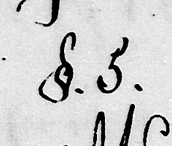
§. 5.
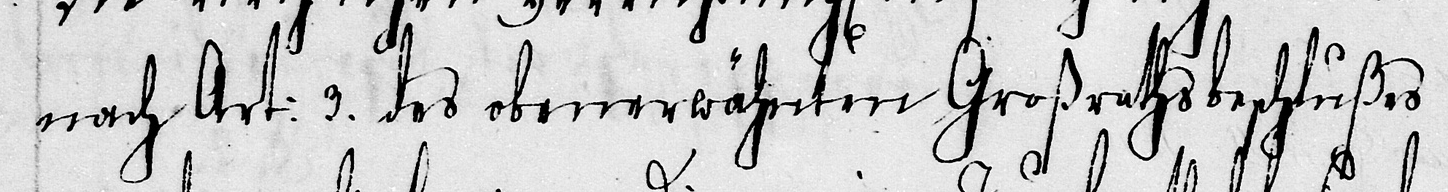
nach Art: 3. des obenerwähnten Großrathsbeschlußes
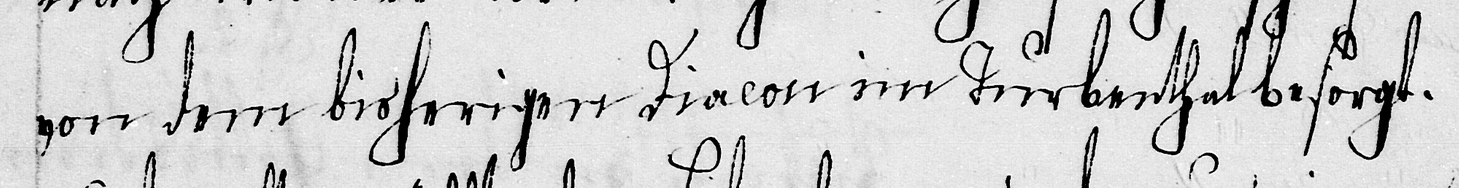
von dem bisherigen Diacon im Turbenthal besorgt.
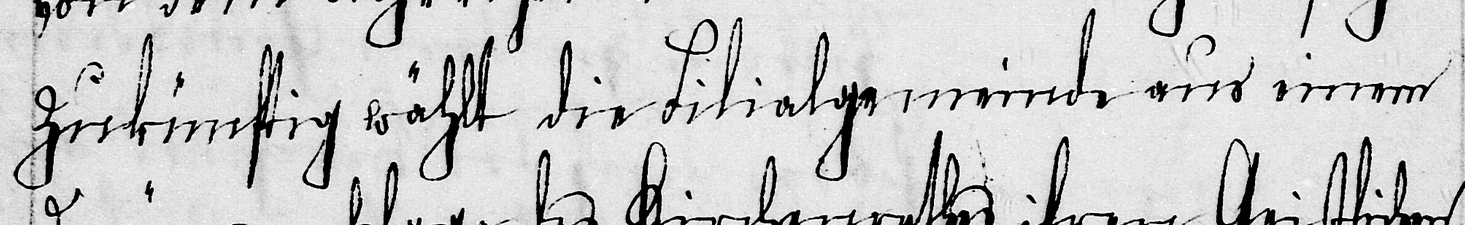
Zukünftig wählt die Filialgemeinde aus einem
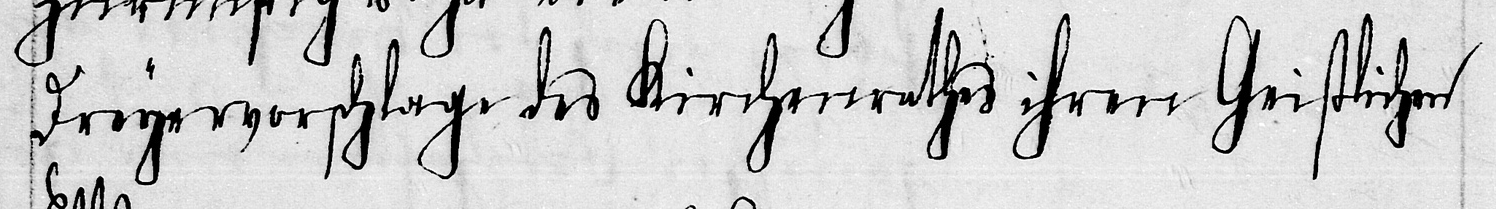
Dreyervorschlage des Kirchenrathes ihren Geistlichen
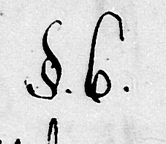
§. 6.
